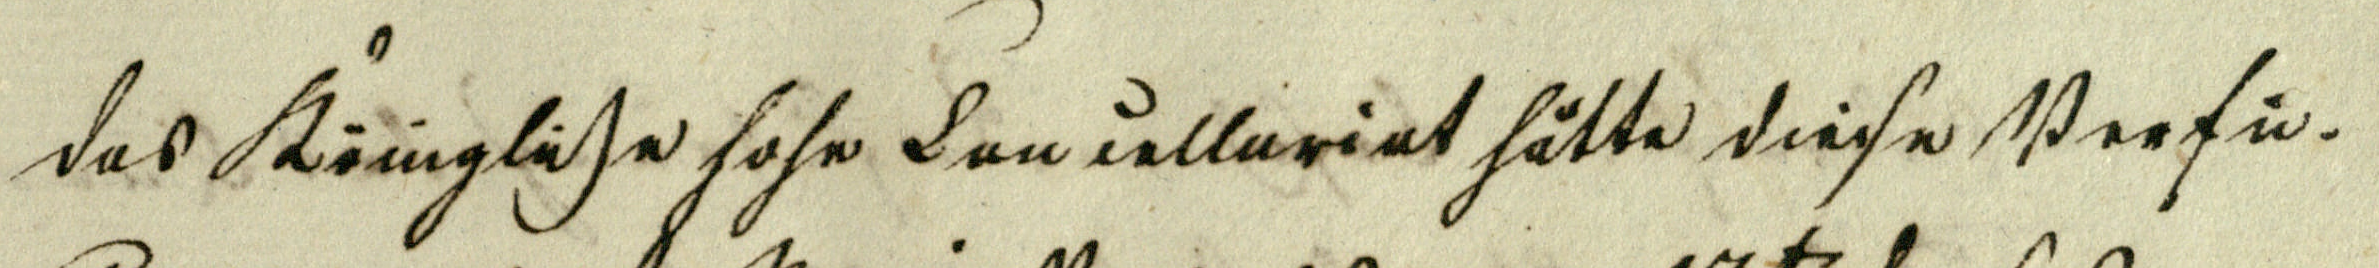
das Köngliche hohe Cancellariat hätte diese Verfü¬
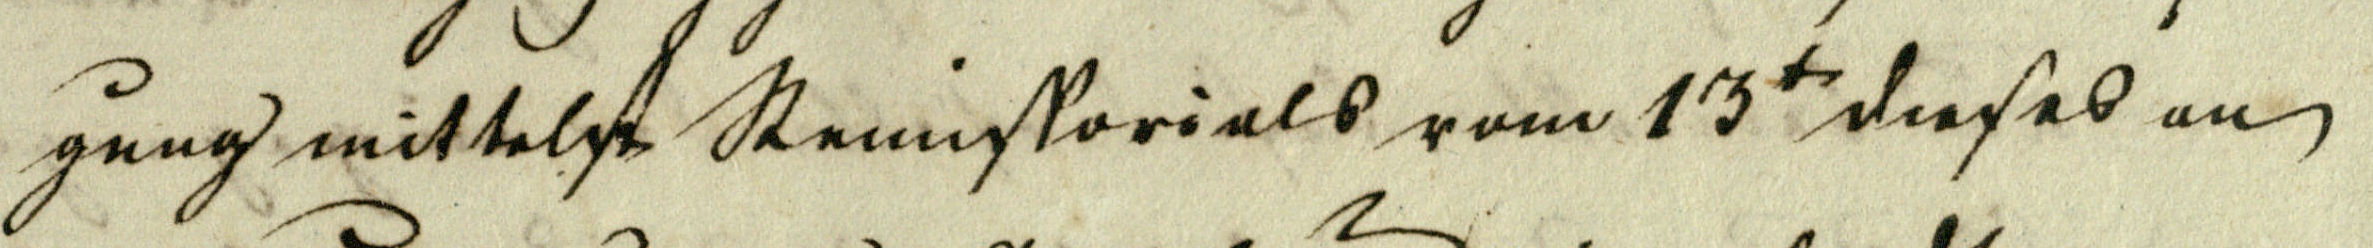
gung mittelst Remissorials vom 13 ten dieses an
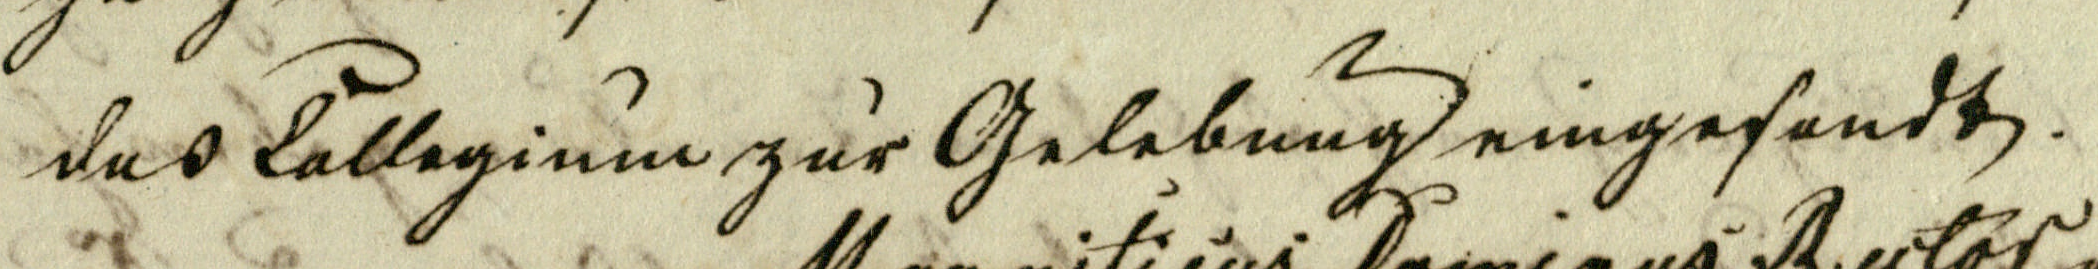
das Collegium zur Gelebung eingesandt.
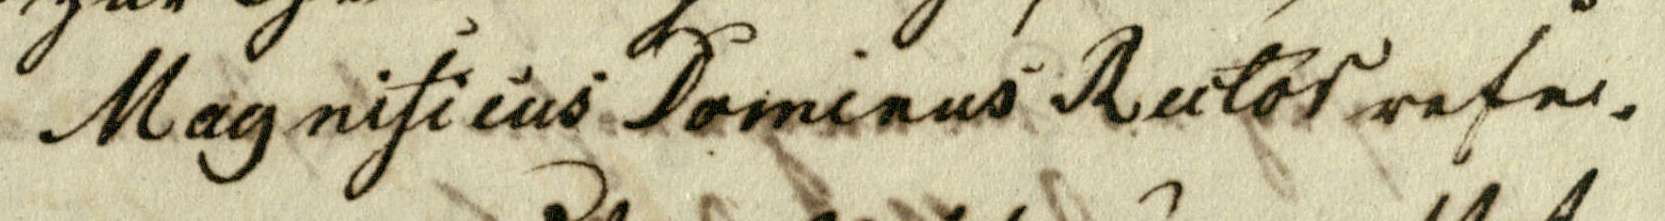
Magnificus Dominus Rector refe¬
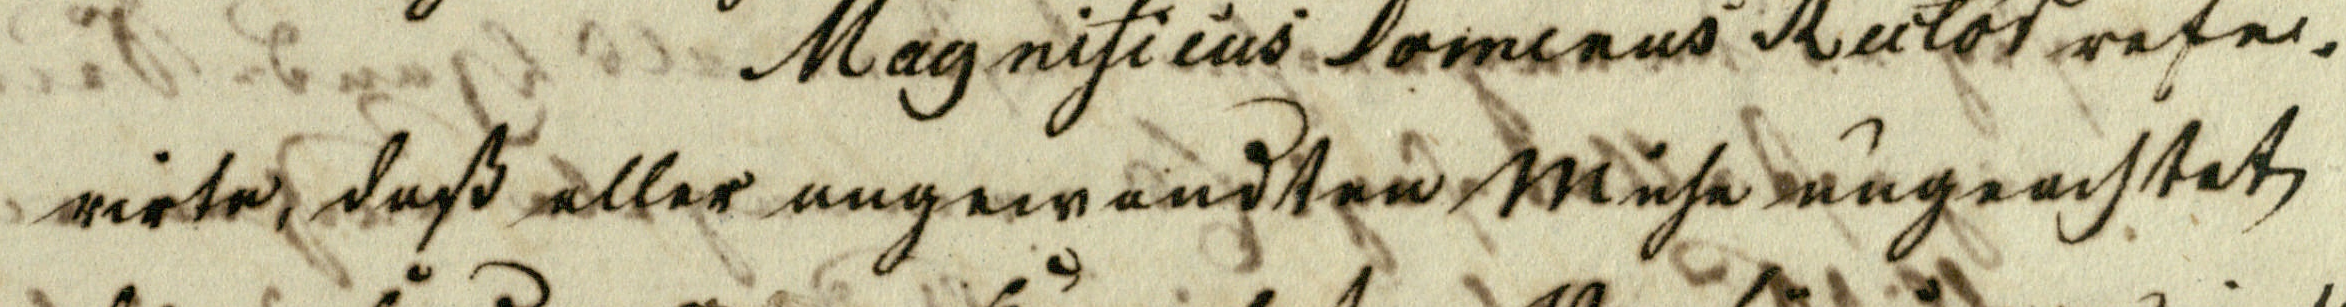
rirte, daß aller angewandten Mühe ungeachtet
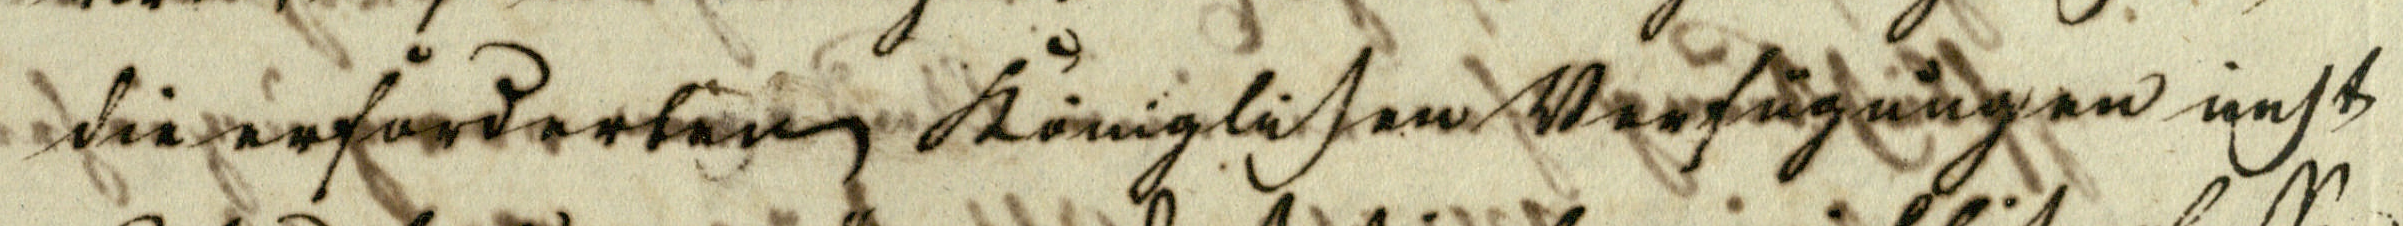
die erforderten, Königlichen Verfügungen nicht
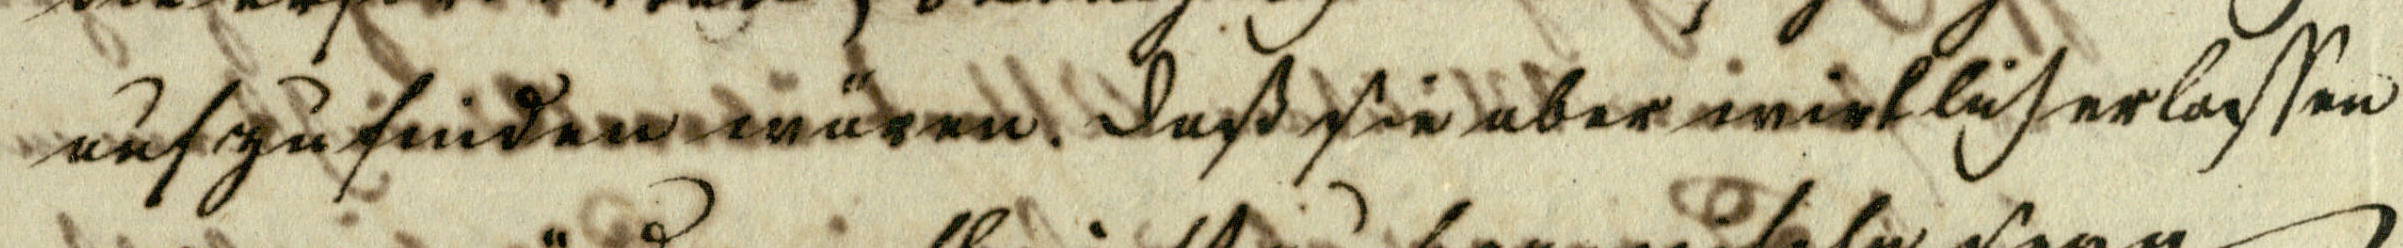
aufzufinden wären. Daß sie aber wirklich erlassen
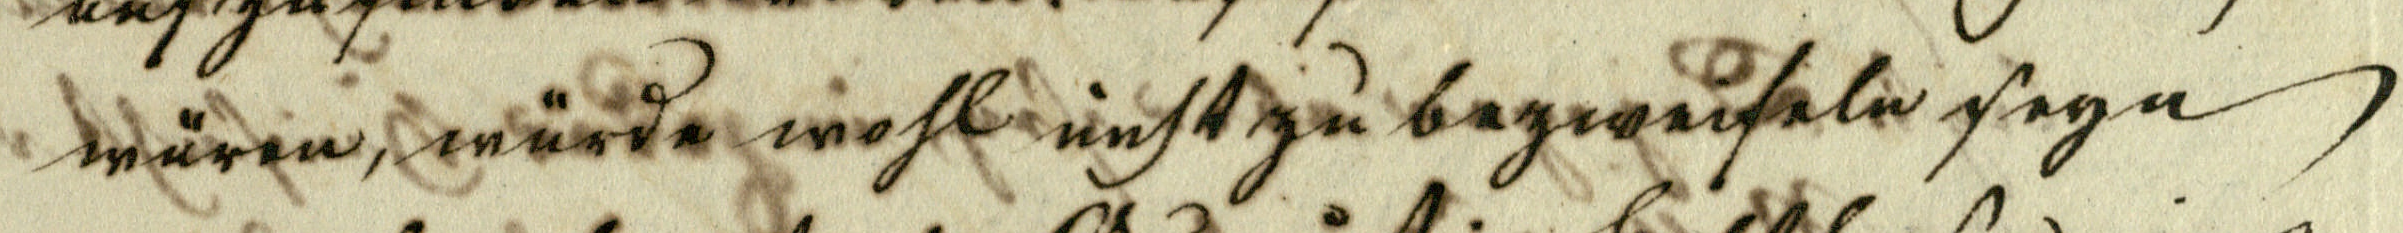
wären, würde wohl nicht zu bezweifeln seyn,
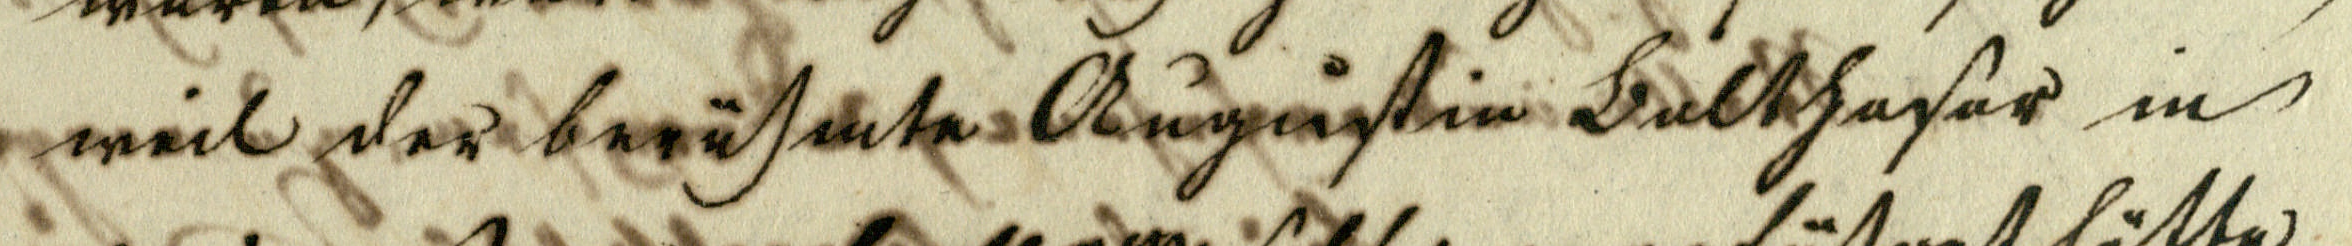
weil der berühmte Augustin Balthasar in
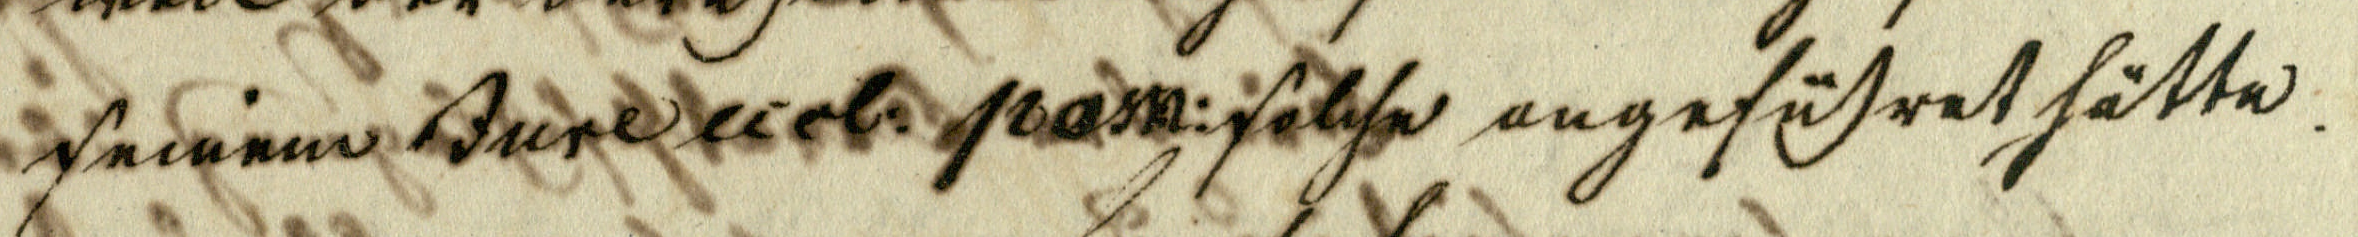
seinem Jure eccl. pom: solche angeführet hätte.
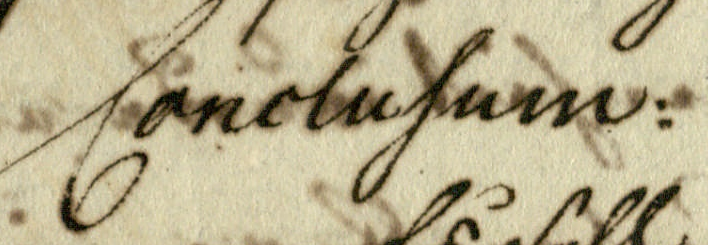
Conclusum:
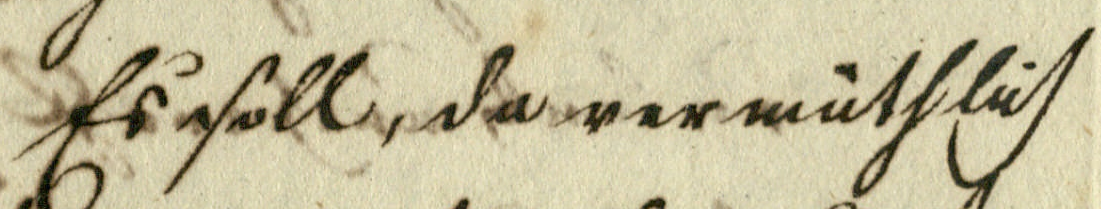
Es soll, da vermuthlich
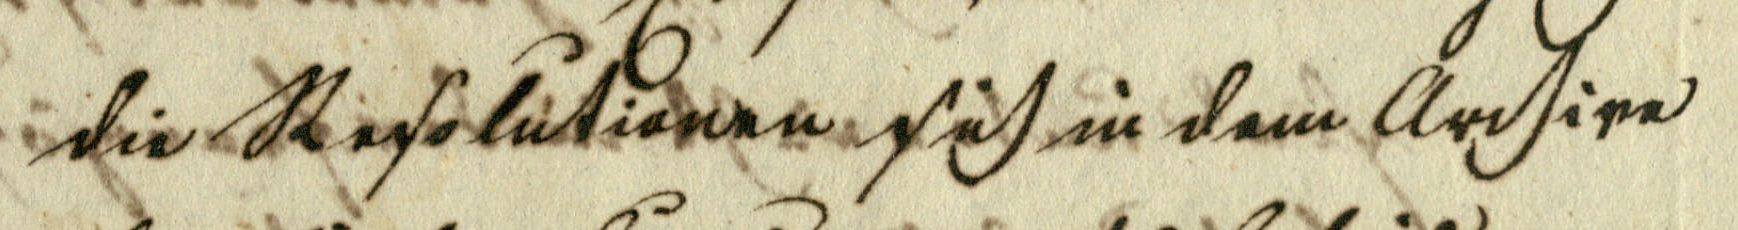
die Resolutionen sich in dem Archive
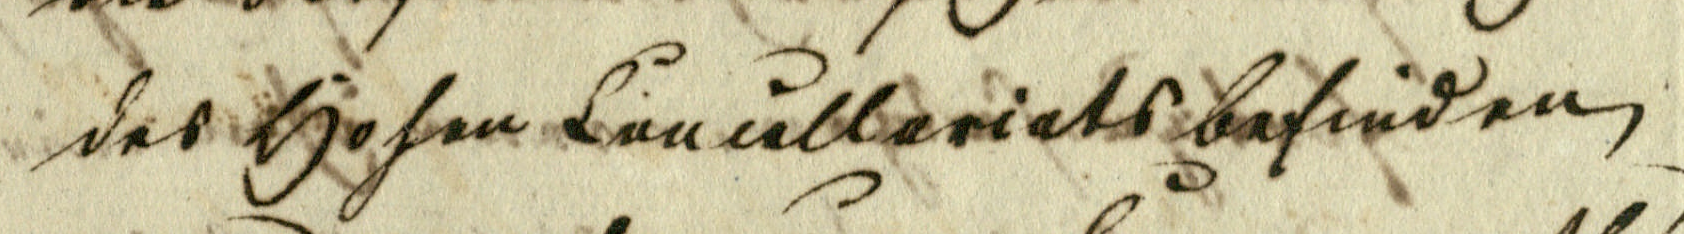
des Hohen Cancellariats befinden
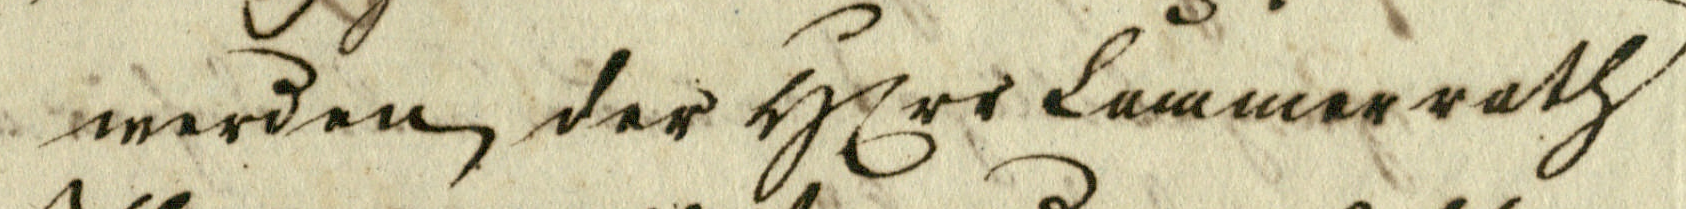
werden, der Herr Cammerrath
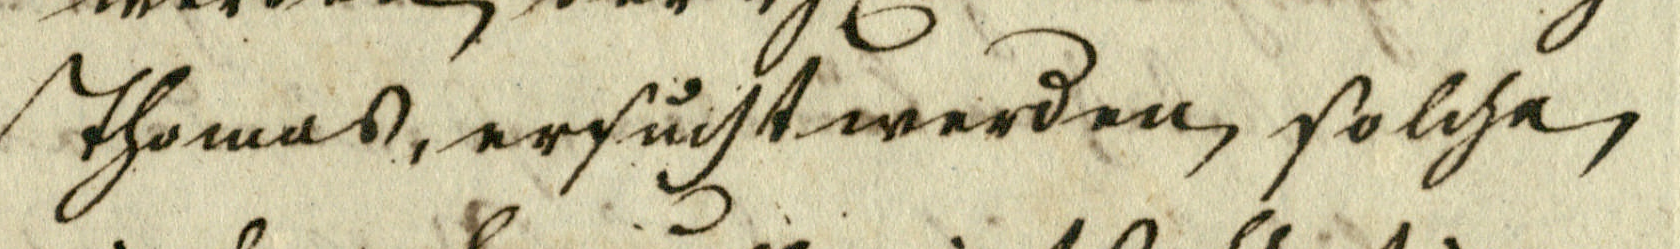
Thomas, ersucht werden, solche
